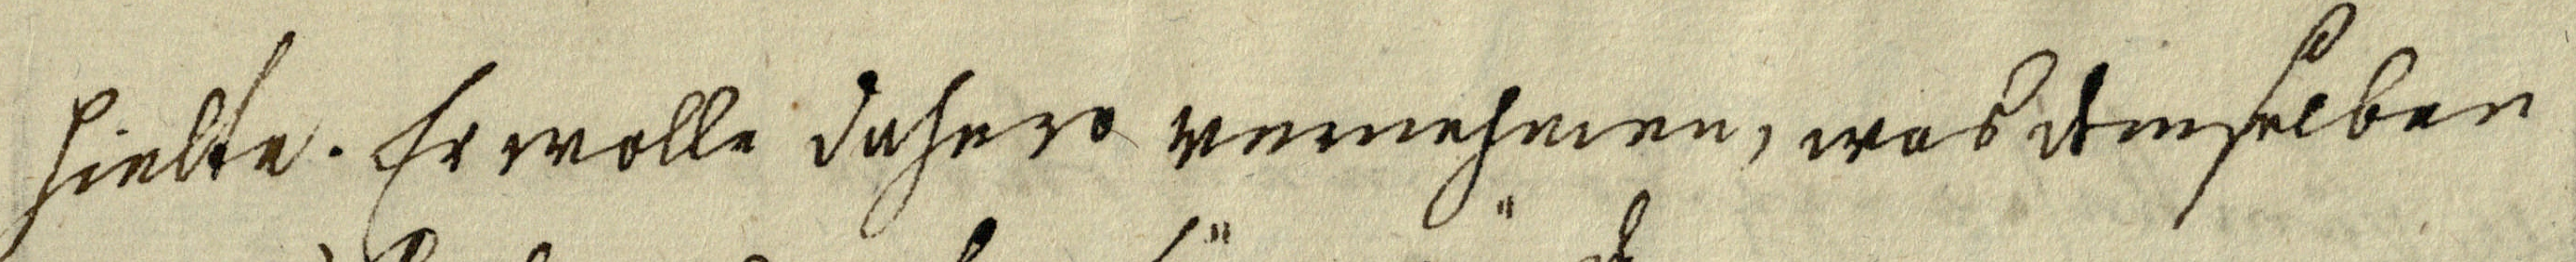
hielte. Er wolle dahero vernehmen, was demselben
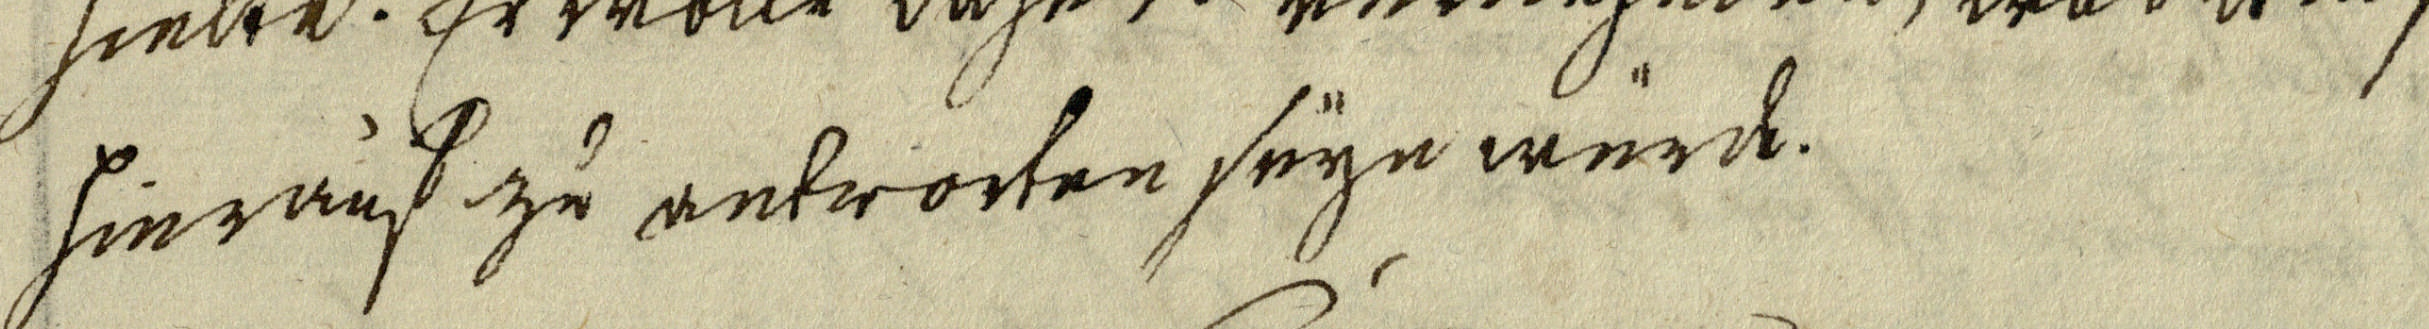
hierauf zu antworten seÿn würde.
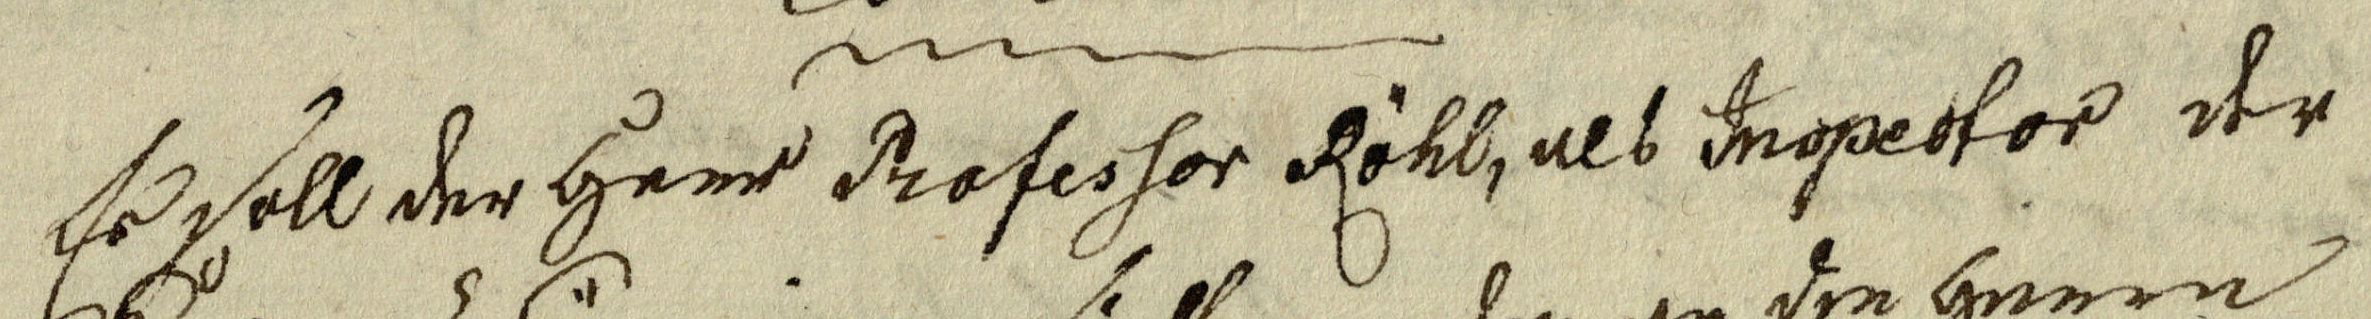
Es soll der Herr Professor Röhl, als Inspector der
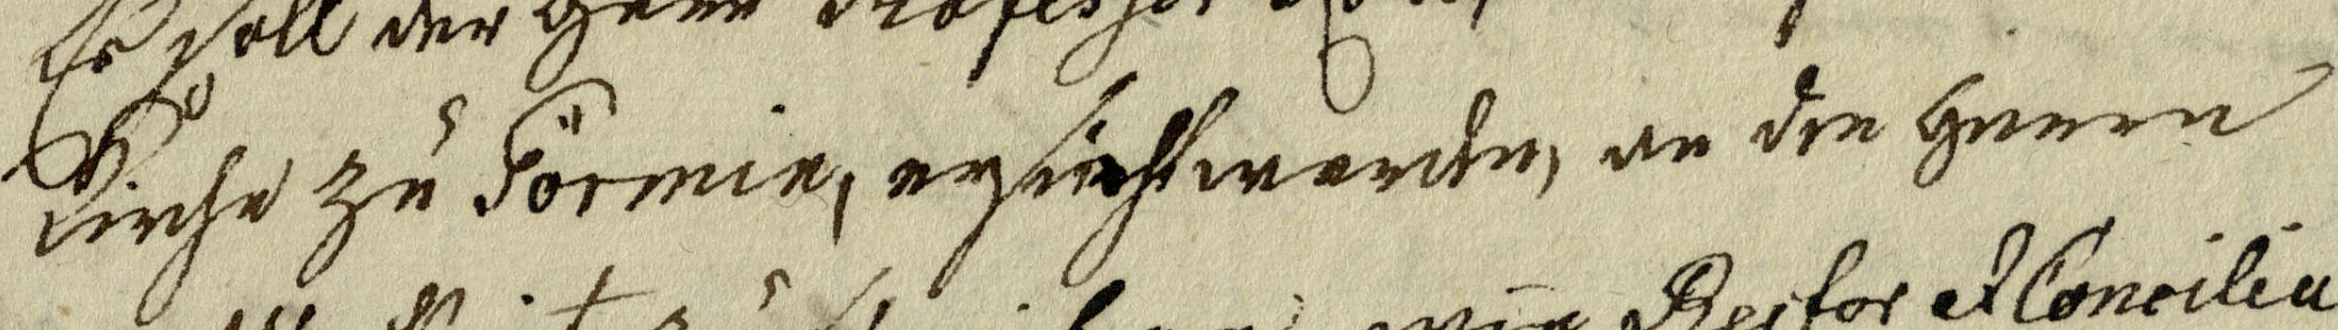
Kirche zu Görmin, ersucht werden, an den Herrn
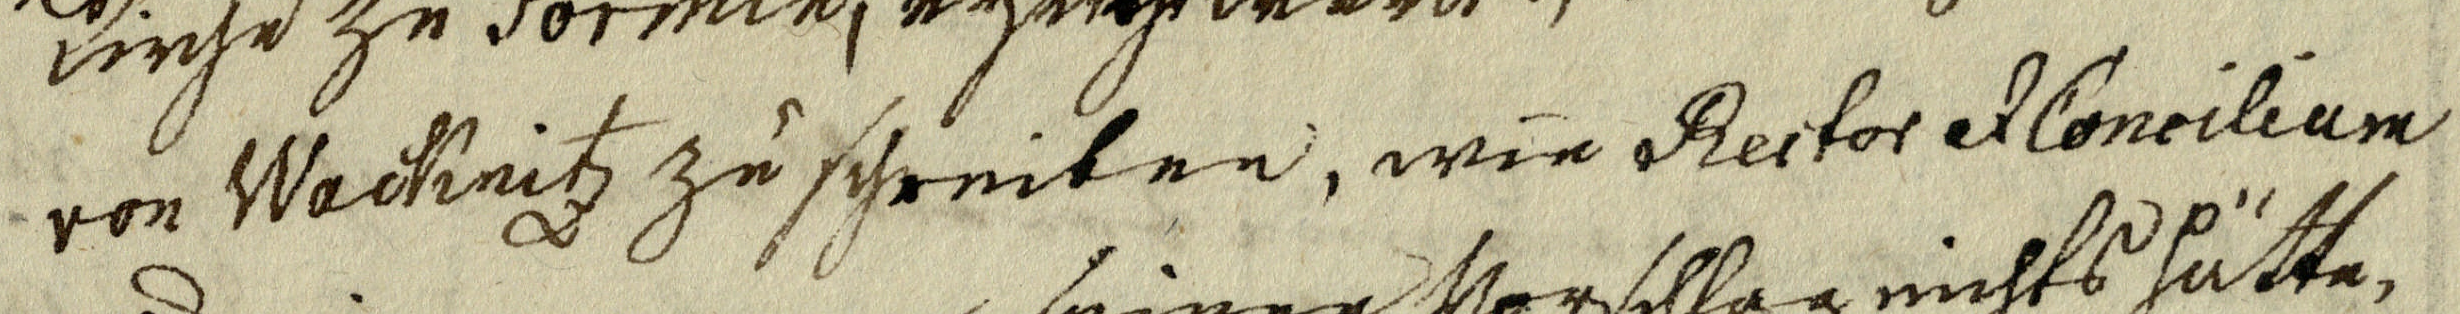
von Wacknitz zu schreiben, wie Rector et Concilium
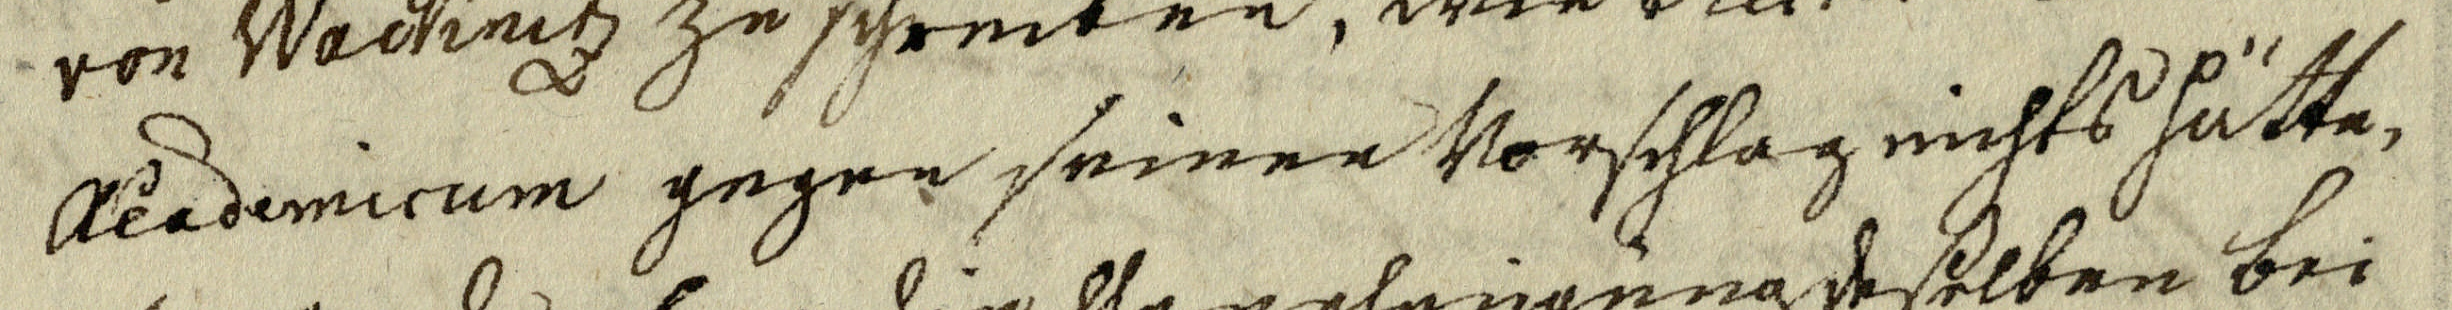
Academicum gegen seinen Vorschlag nichts hätte,
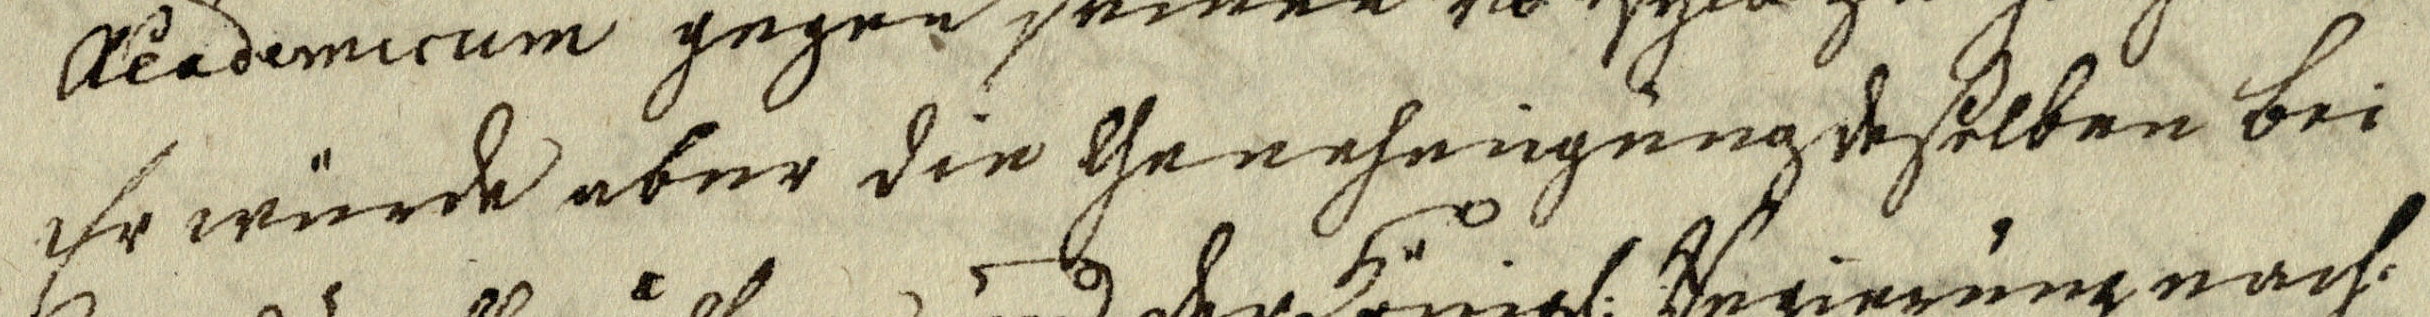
Er würde aber die Genehmigung desselben bei
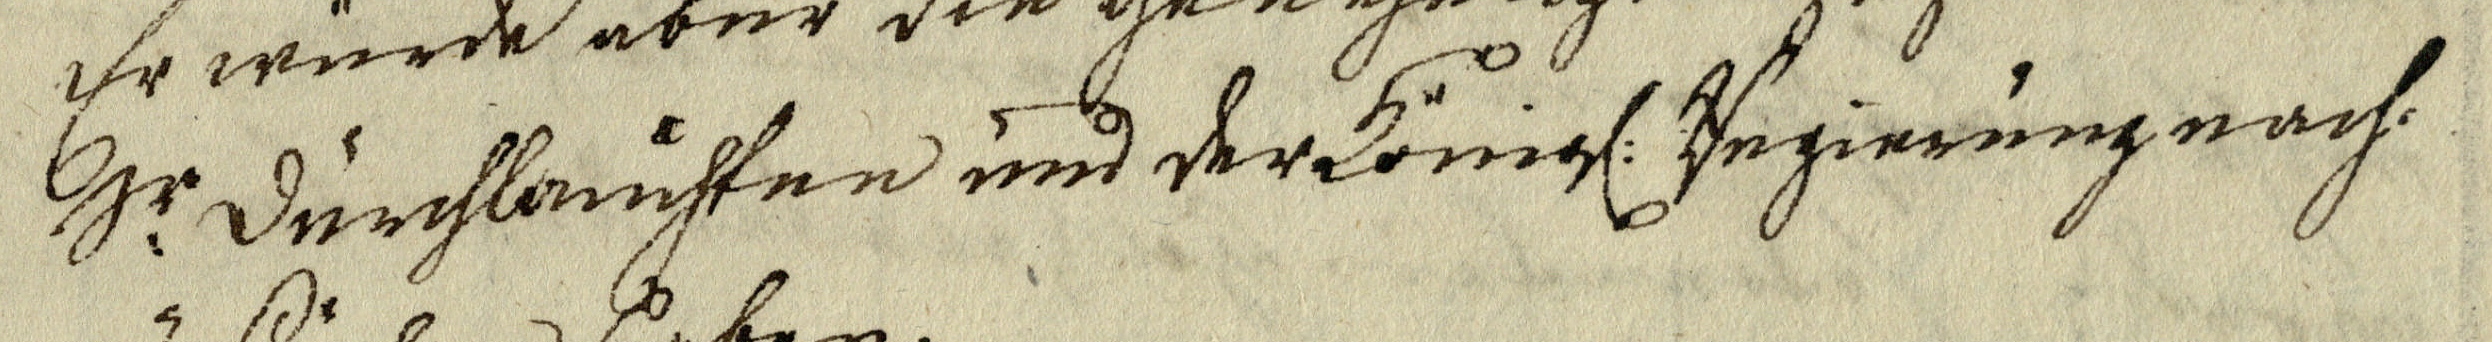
Sr Durchlauchten und der Königl. Regierung nach¬
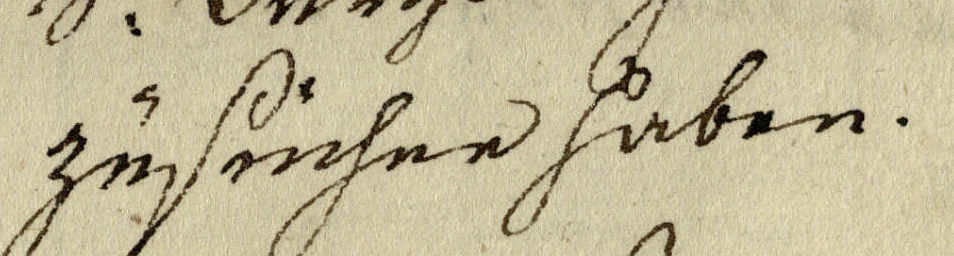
zusuchen haben.
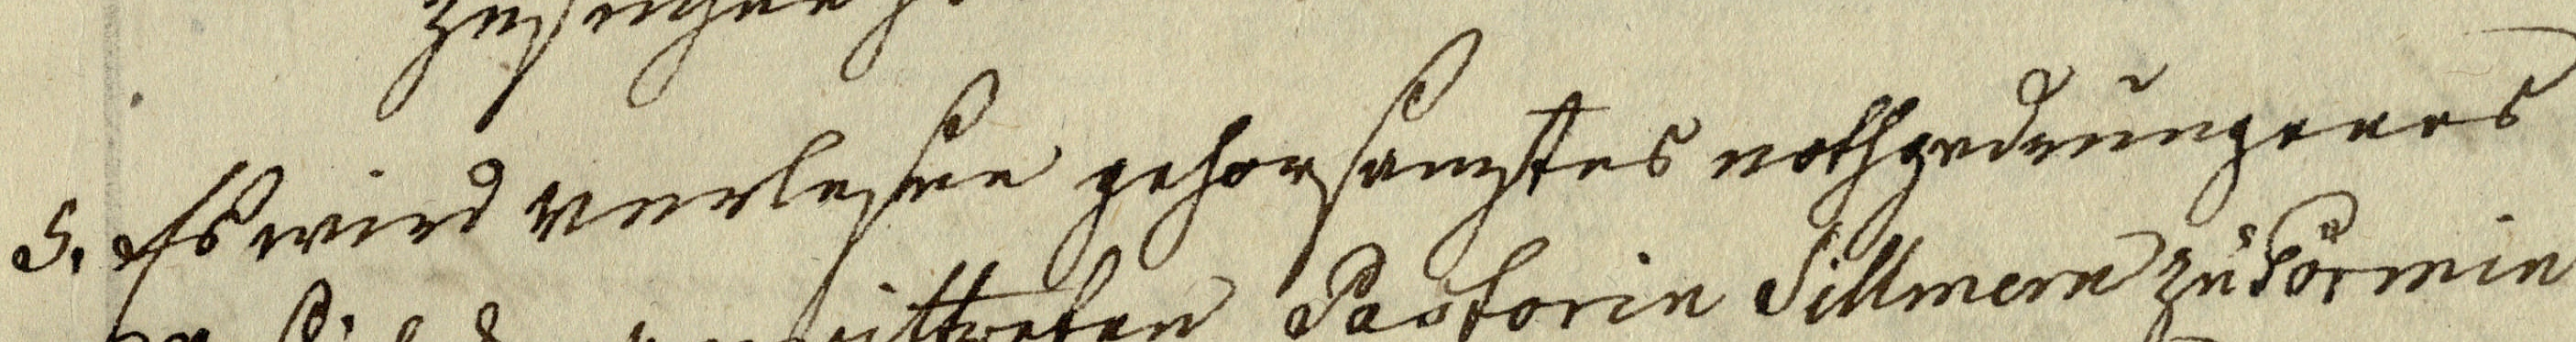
5. Es wird verlesen gehorsamstes nothgedrungenes
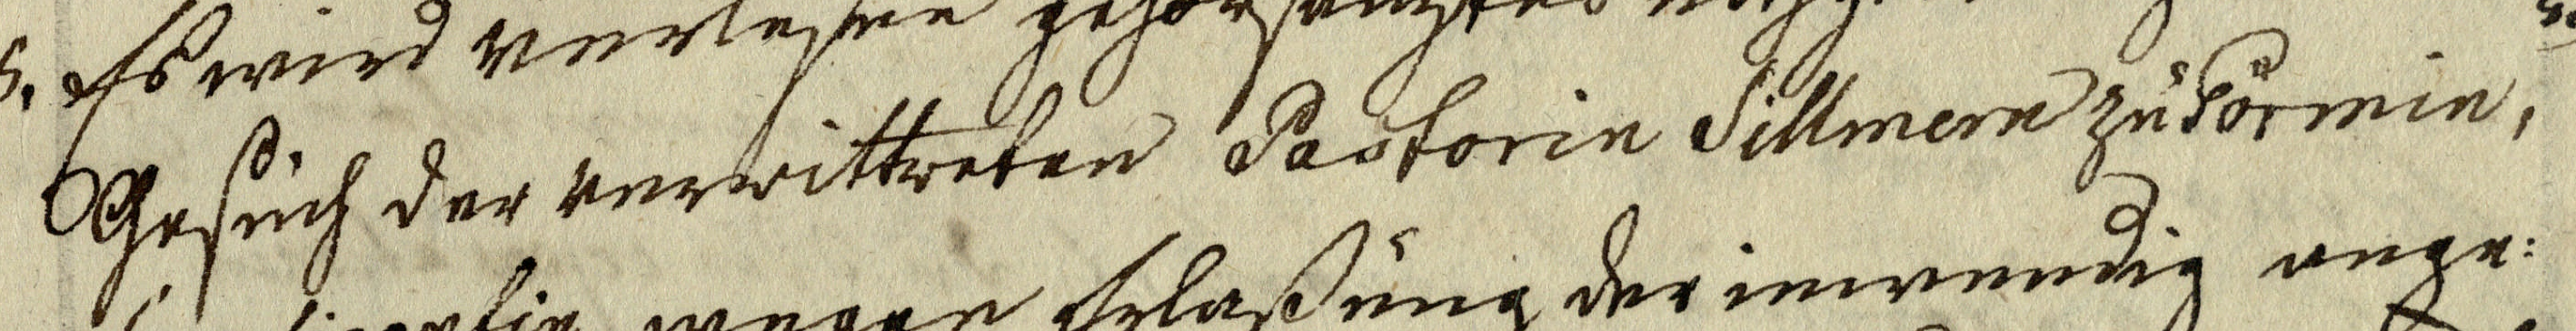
Gesuch der verwittweten Pastorin Sillmern zu Görmin,
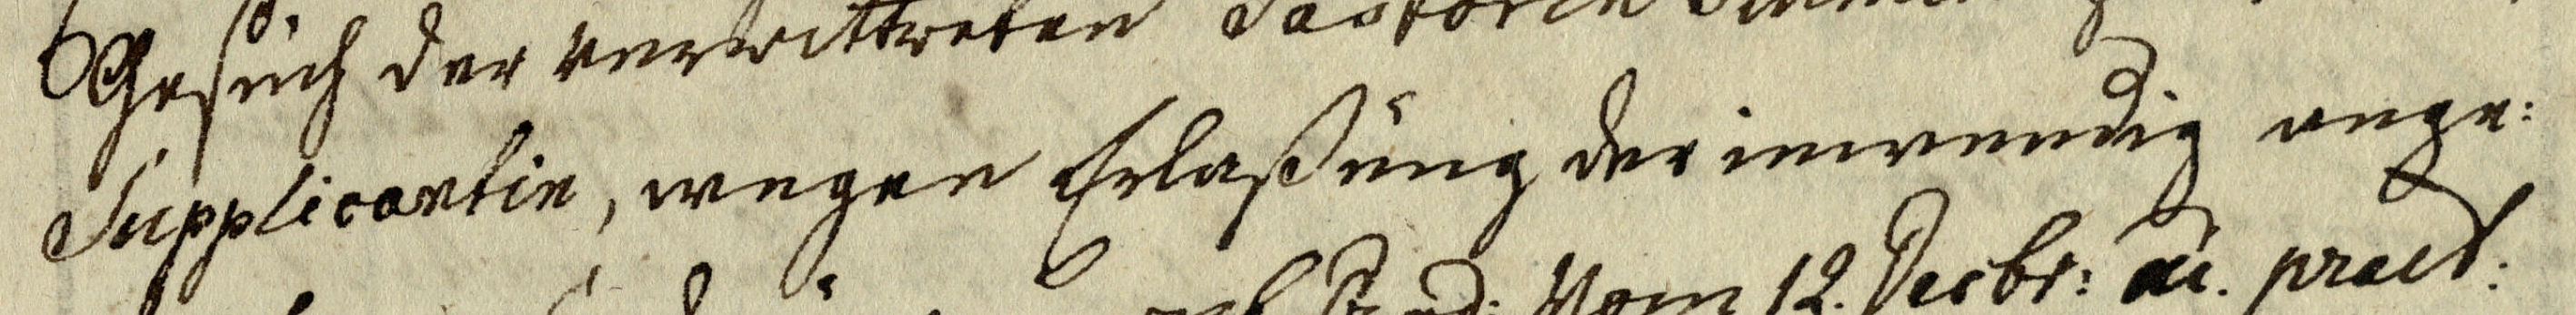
Supplicantin, wegen Erlassung der inwendig ange¬
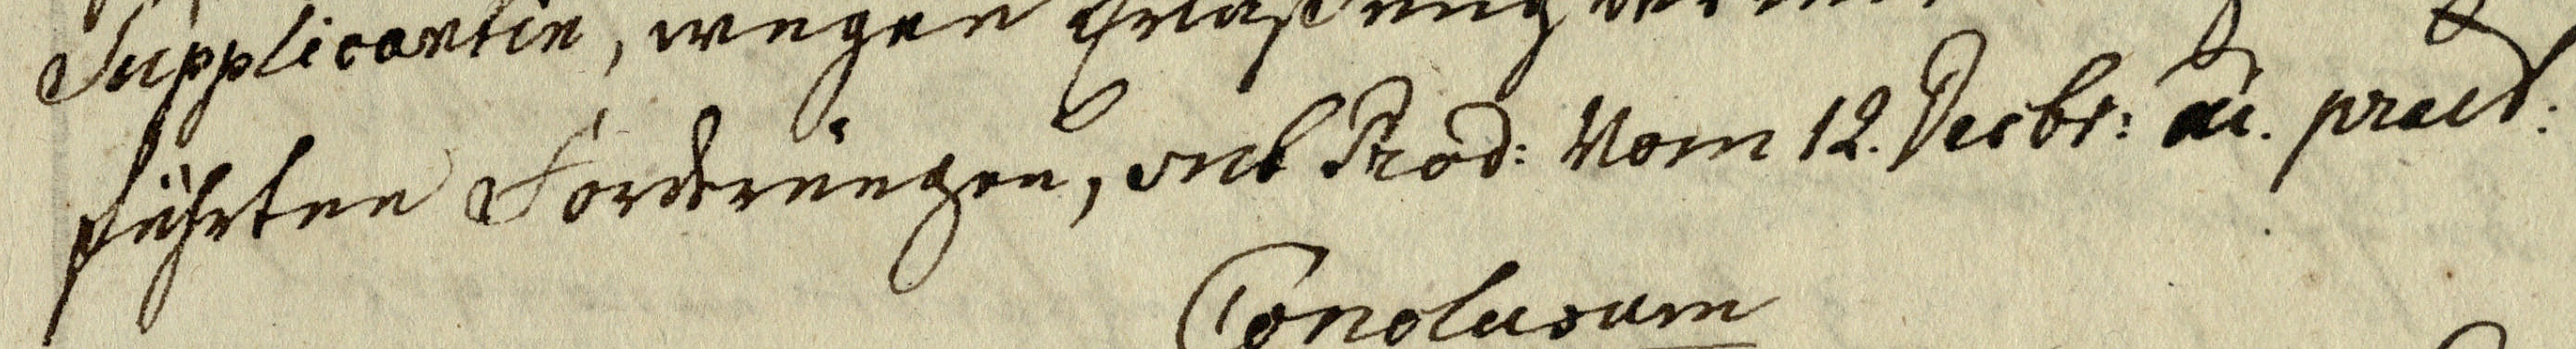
führten Forderungen, sub Prod. vom 12. Decbr.ac. praet.
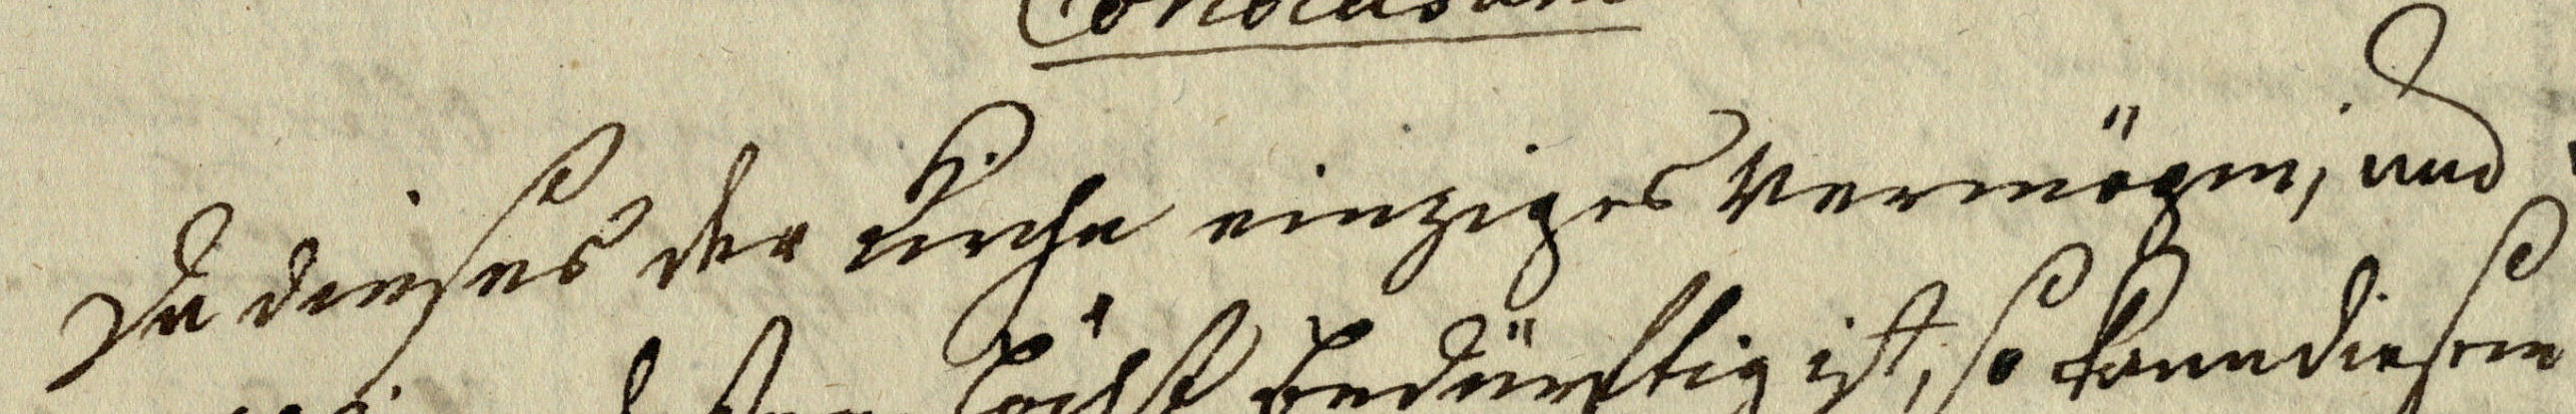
Da dieses der Kirche einziges Vermögen; und
